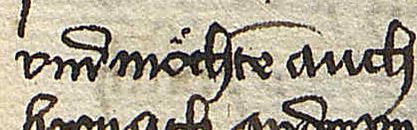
vnd möchte* auch
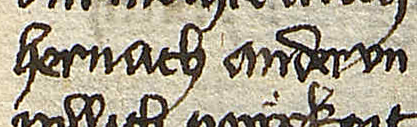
hernach an der vn
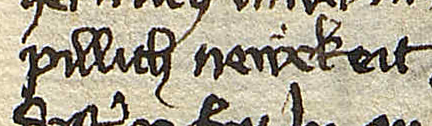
pillich neẅekeit
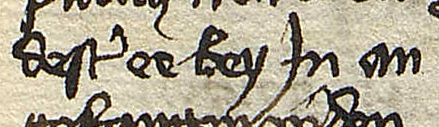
deſt* ee bey In an
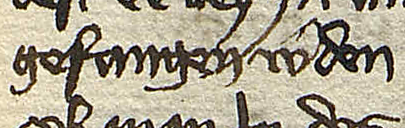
gefangen w*den
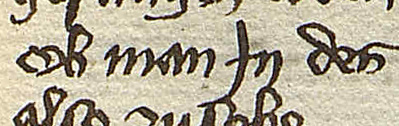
Ob man In des
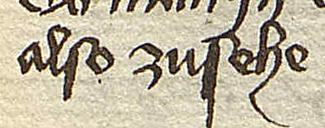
alſo ʒuſehe
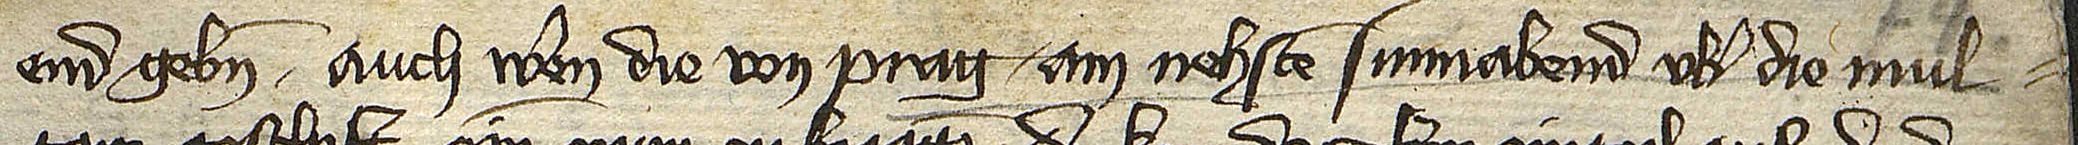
end hebn* / auch w*en die von Prag / am nehſte* ſunnabend vb* die mul =
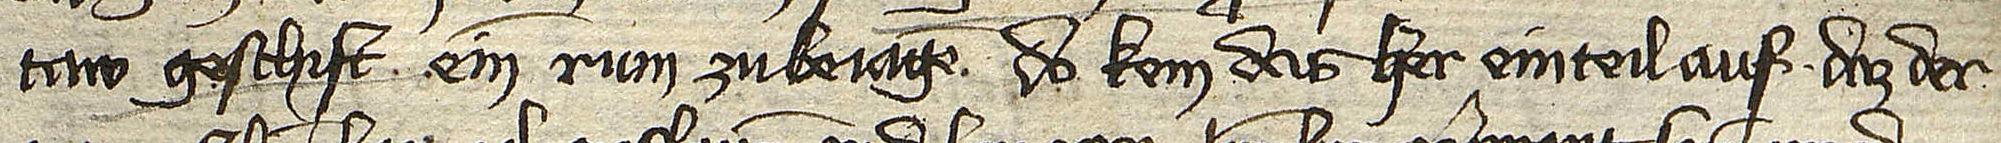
taw geſchift ein* rum ʒu beiage* . Do kem das her einteil auf . daʒ der
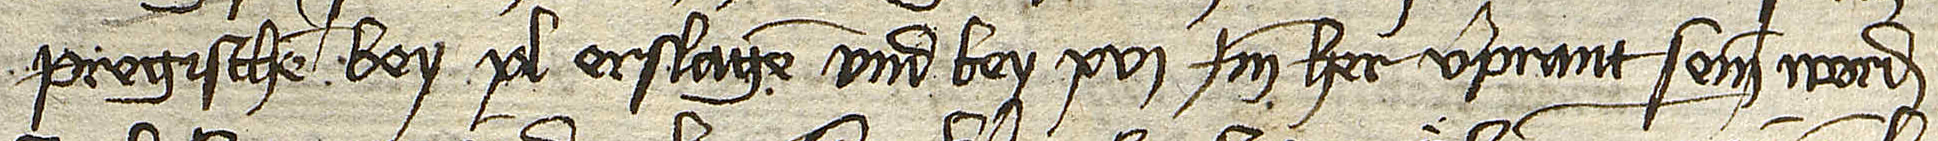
Pregiſche* bey xl erſlage* vnd bey xvi Im* her v*prant ſein word*
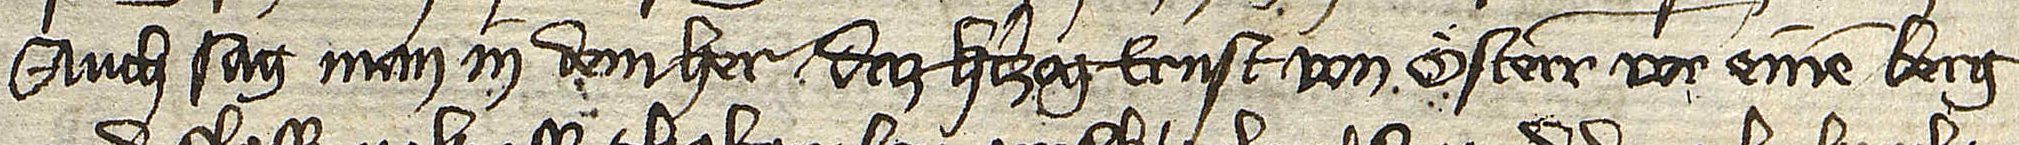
Auch ſag man in dem her / Daʒ h*cʒog Ernſt von Öſterr* vor eine* berg
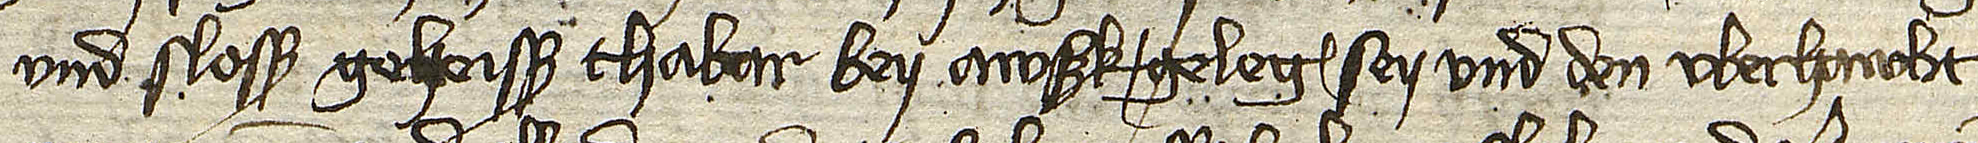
vnd ſloſſ* geheiſſ* thabar bey awſʒk / geleg* ſey vnd den vberhawbt
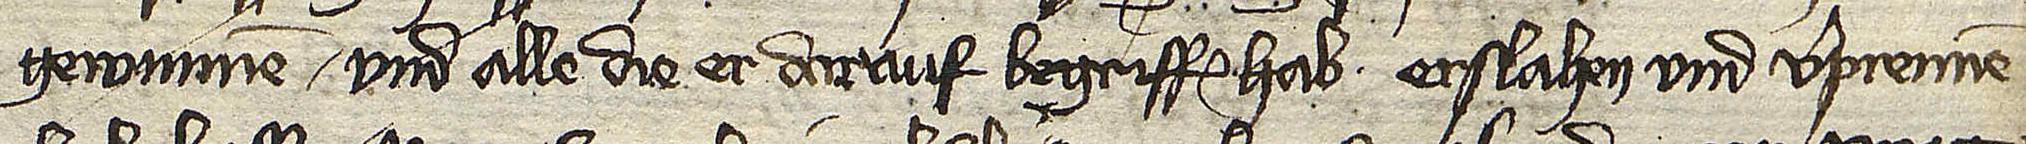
gewunne* / vnd alle die er darauf begriff* hab . erſlahen vnd v*prenne*
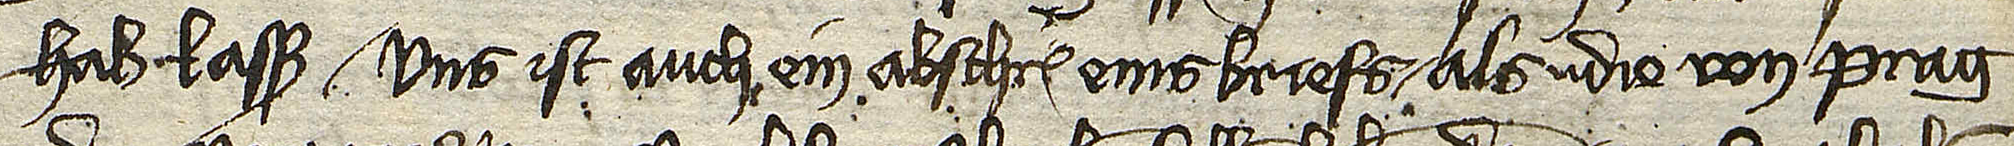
hab laſſ* / Vns iſt auch ein abſchr* eins briefs / als ~ die von Prag
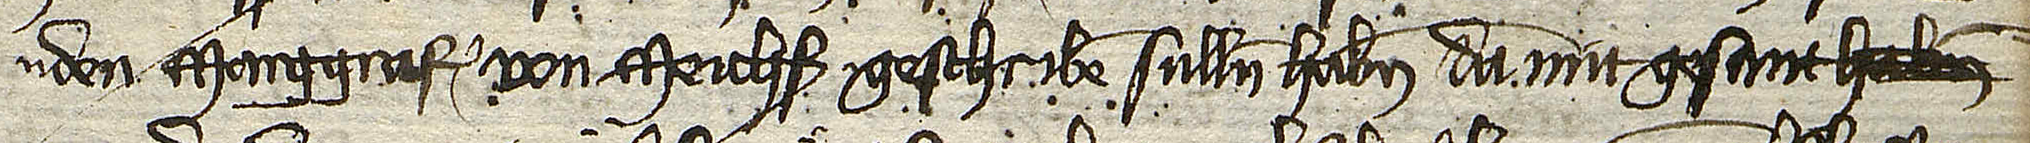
~ den Marggraf* von Meichſ* geſchribe* ſulln* habn* / da mit geſant habn*
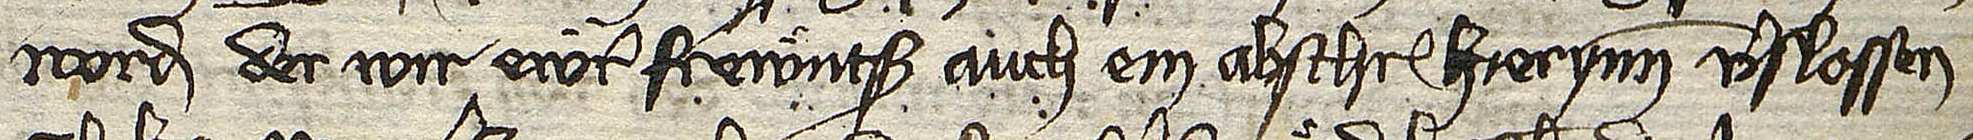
word* der wir eẅr* freẅntſ* auch ein abſchr* hierynn* v*ſloſſen
